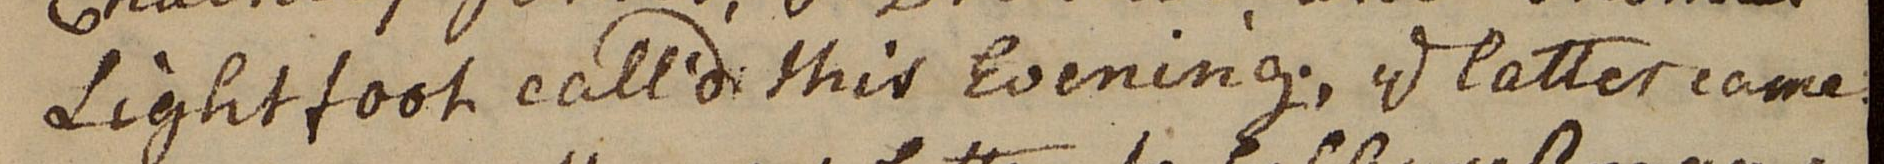Lightfoot call'd this Evening; y^e latter came
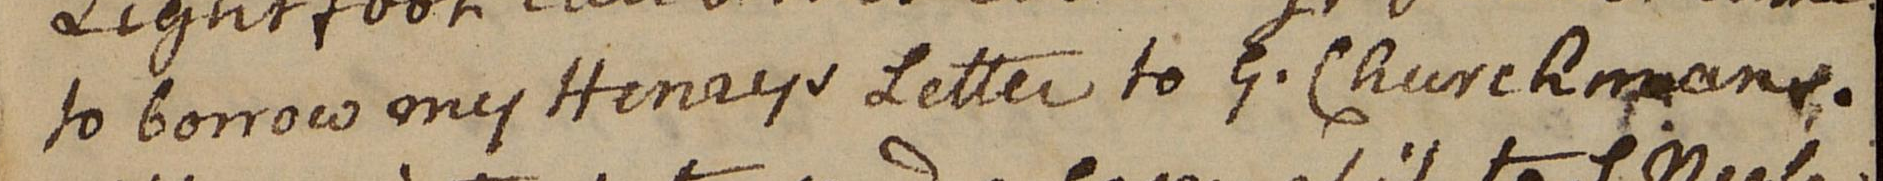to borrow my Henrys Letter to G. Churchmans.
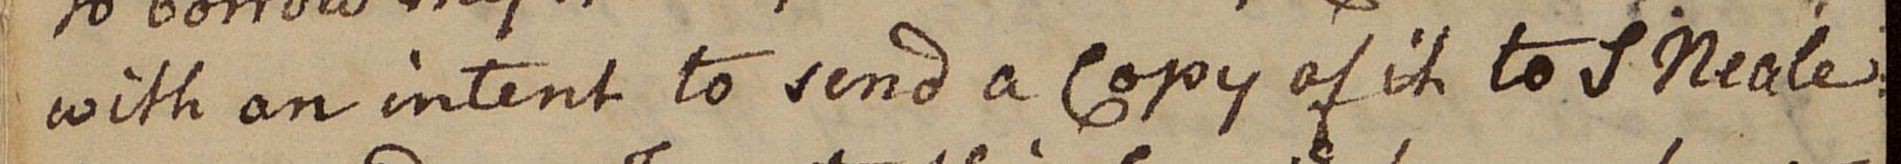with an intent to send a Copy of it to S Neale
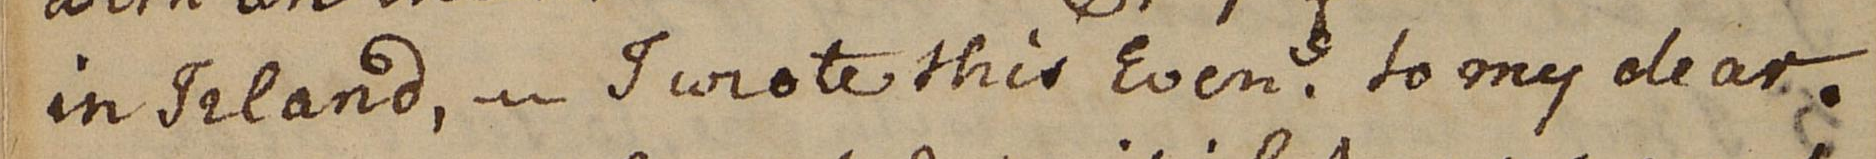in Island,- I wrote this Even^g. to my dear.
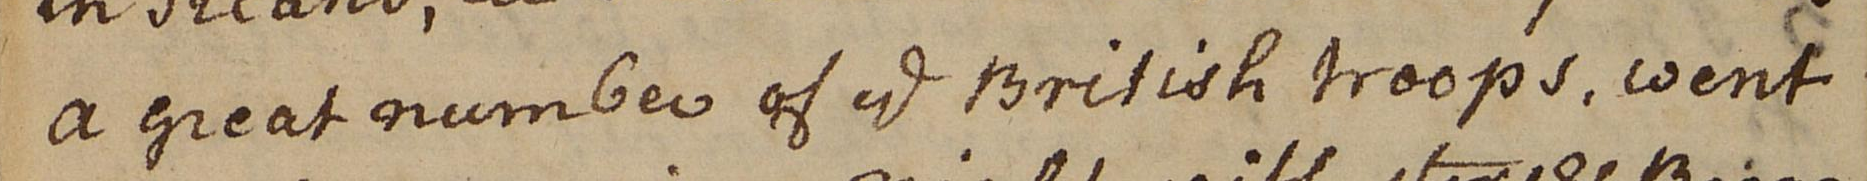a great number of y^e British troops, went
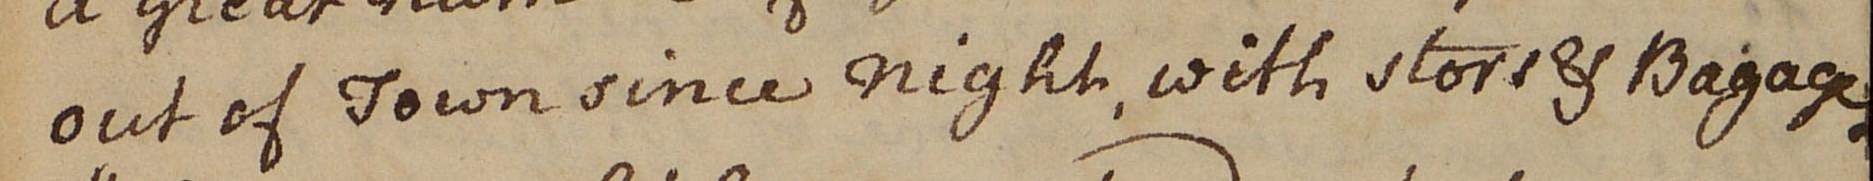out of Town since night, with stors & Bagag
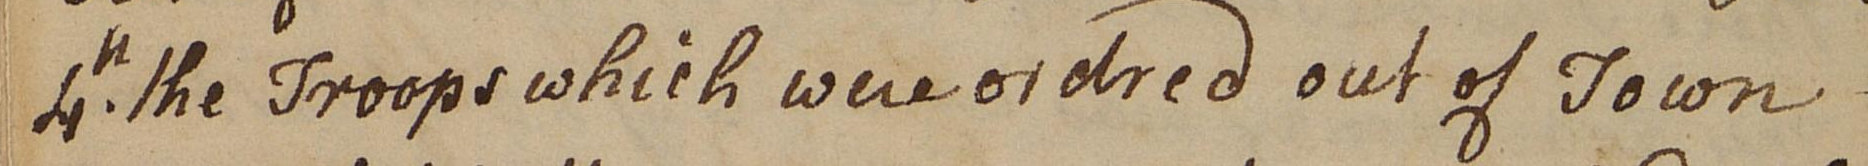4^h. the Troops which were ordred out of Town
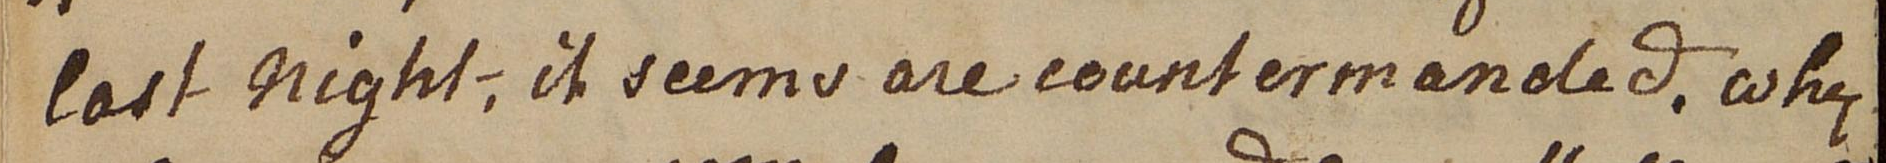last night; it seems are countermanded, why
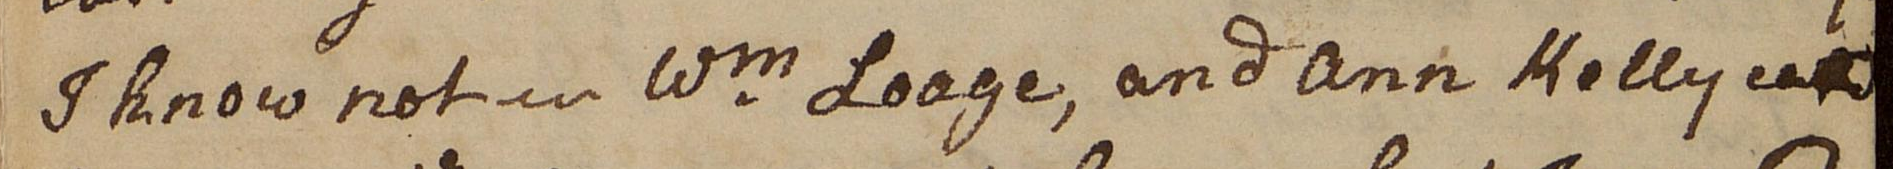I know not - W^m. Loage, and Ann Kelly calld
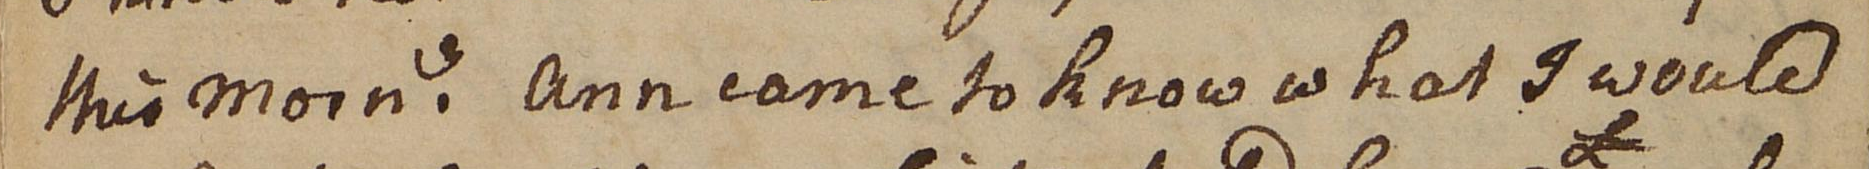this morn^g. Ann came to know what I would
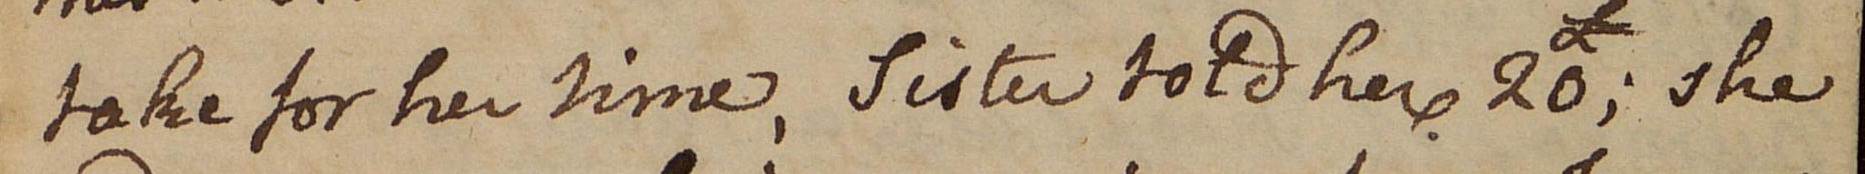take for her time, Sister told her 20^£; she
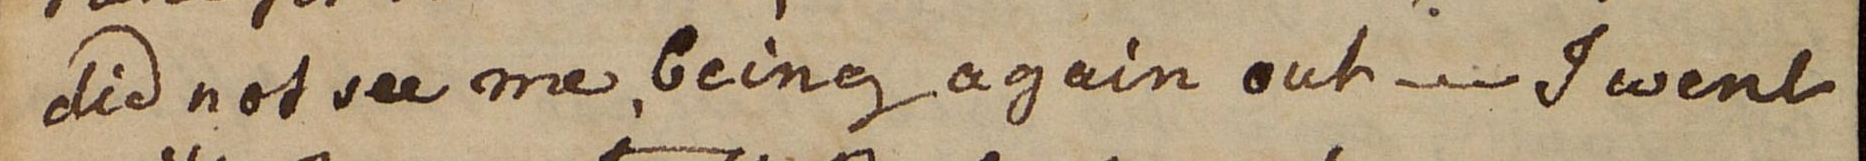did not see me, being again out- I went
